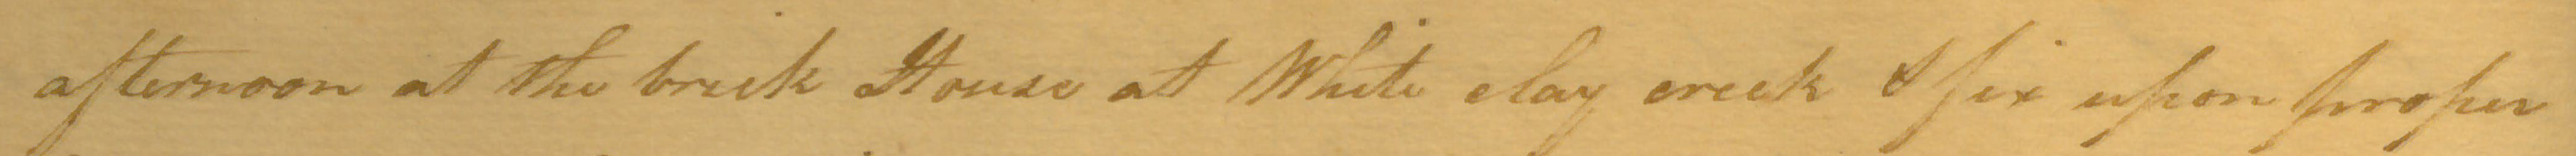afternoon at the brick House at White clay creek & fix upon proper
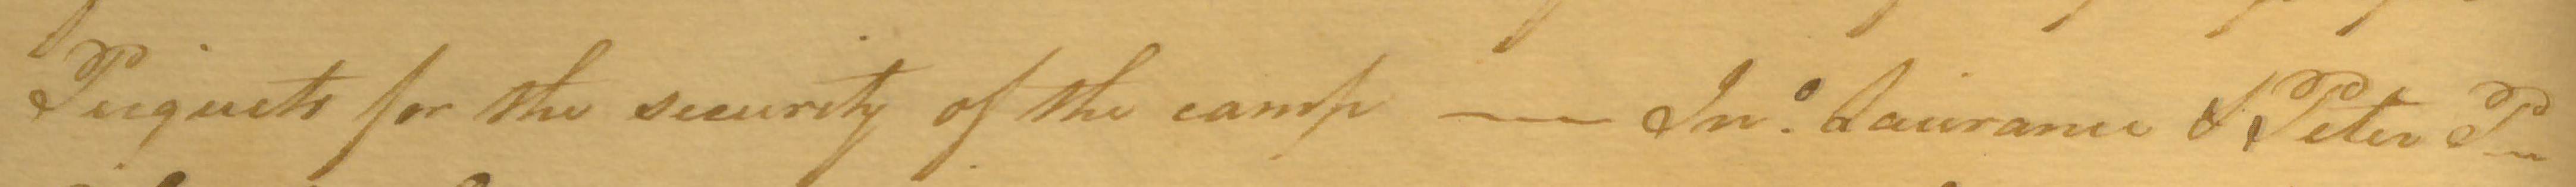Picquets for the security of the camp- Jn^o. Laurance & Peter P.
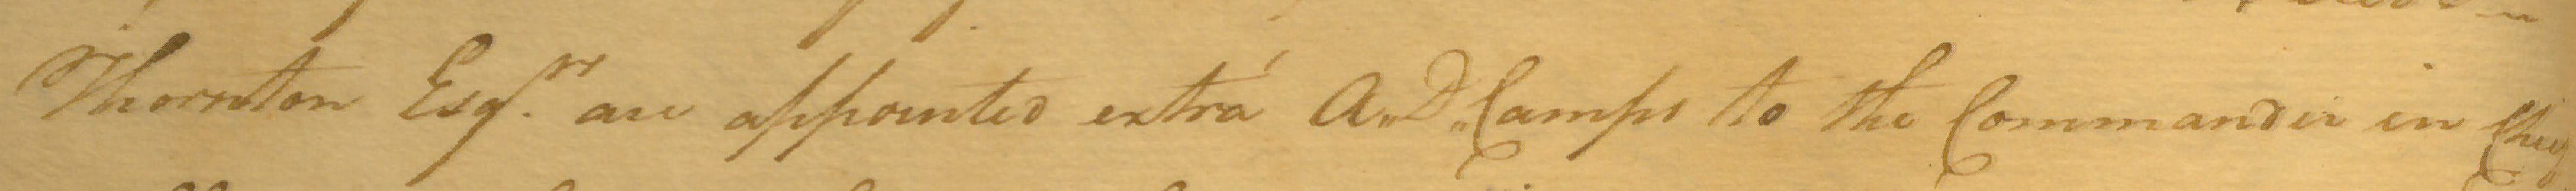Thornton Esq^r. are appointed extra A. D. Camps to the Commander in Chief
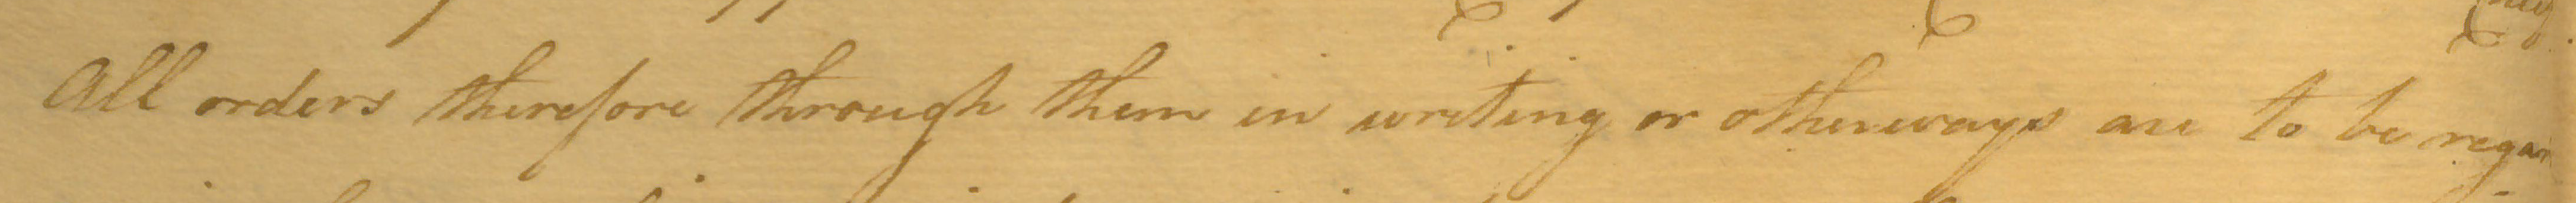All orders therefore through them in writing or otherways are to be regard
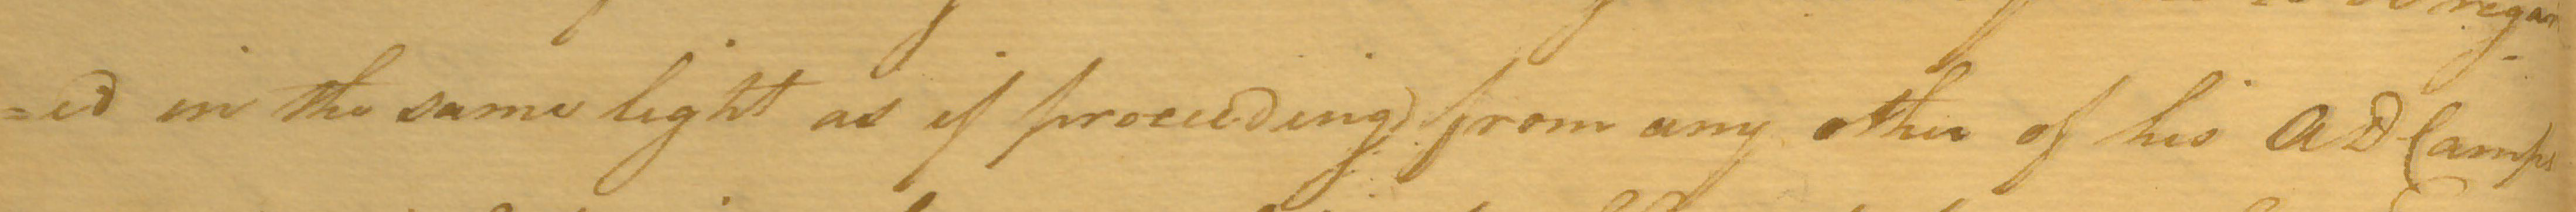-ed in the same light as if proceeding from any other of his A D Camps
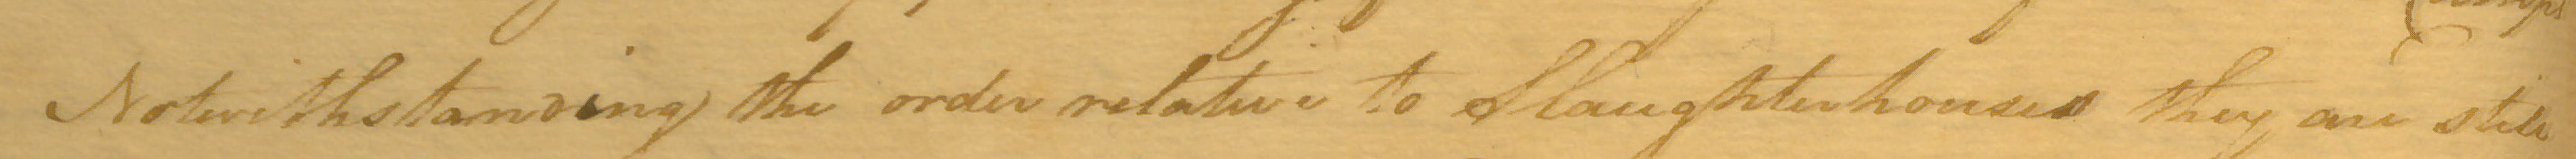Notwithstanding the order relative to Slaughterhouses they are still
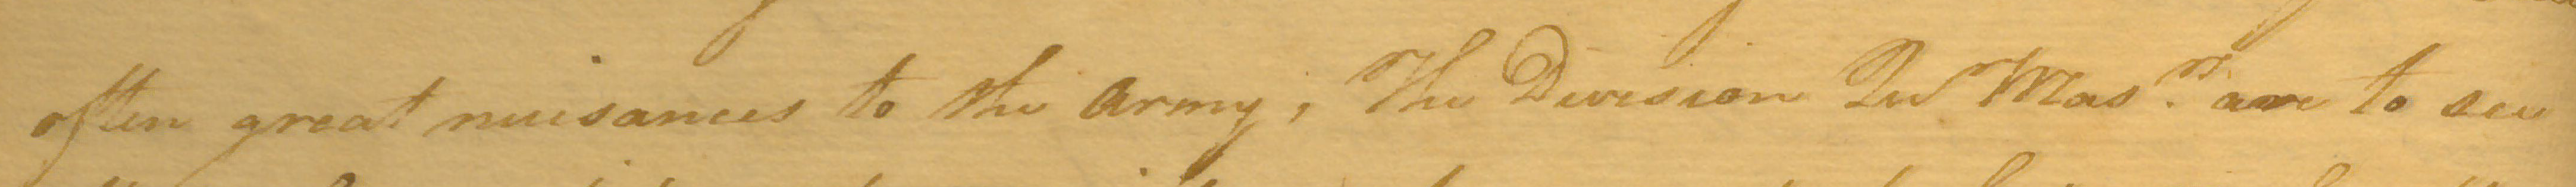often great nuisances to the Army, The Division Qu^r Mas^rs. to see
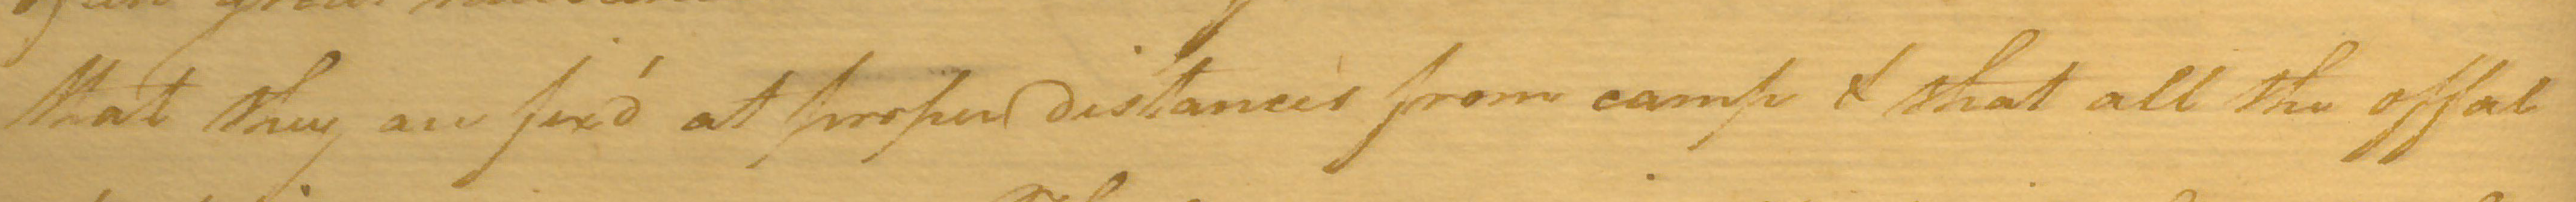that they are fix'd at proper distances from camp & that all the offal
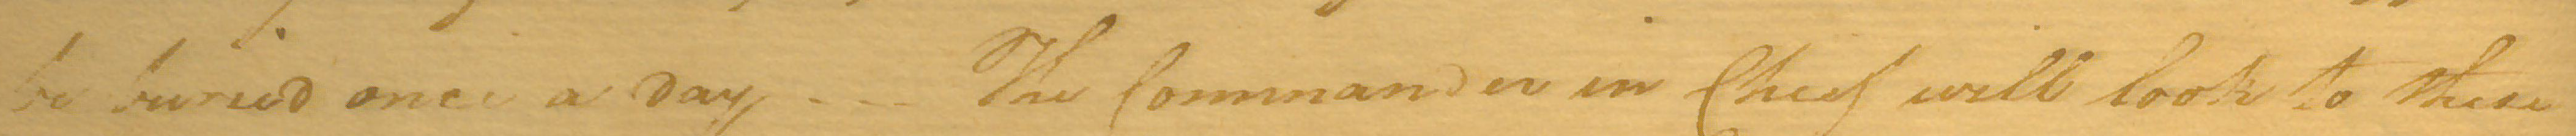be buried once a day. The Commander in Chief will look to these
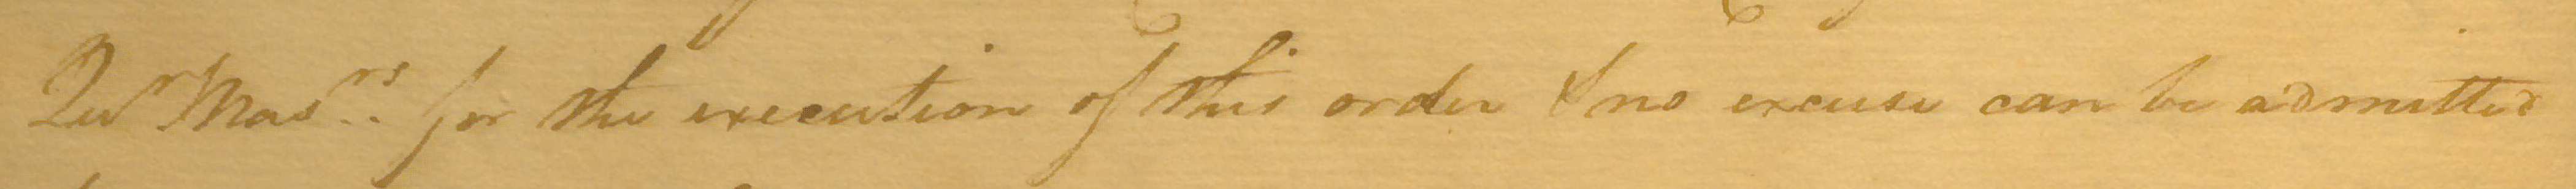Qu^r. Mas^rs. for the execution of this order & no excuse can be admitted
